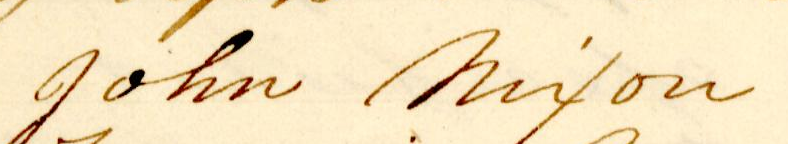John Nixon
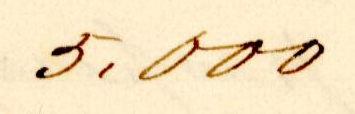5,000
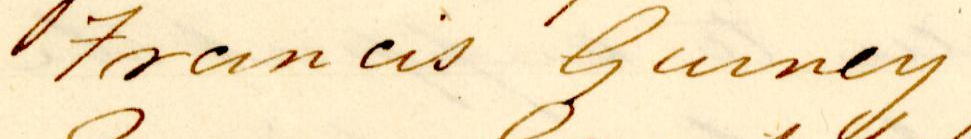Francis Gurney
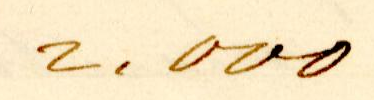2,000
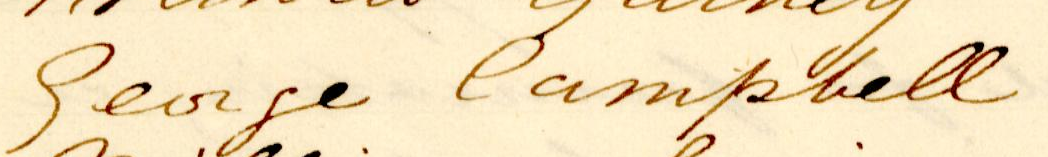George Campbell
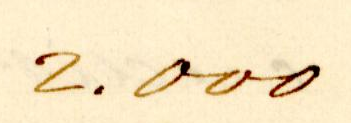2,000
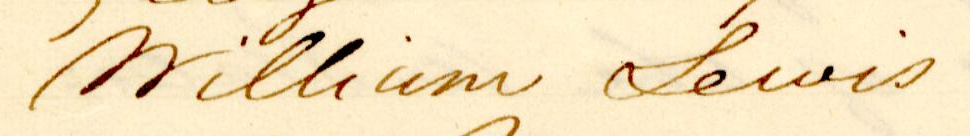William Lewis
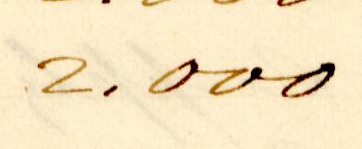2,000
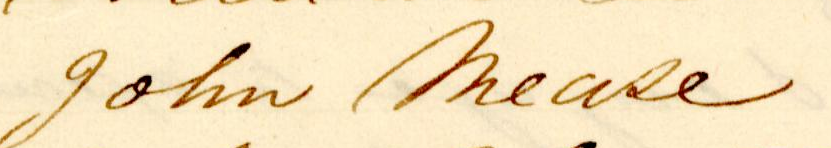John Mease
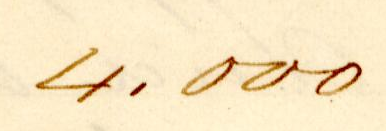4,000
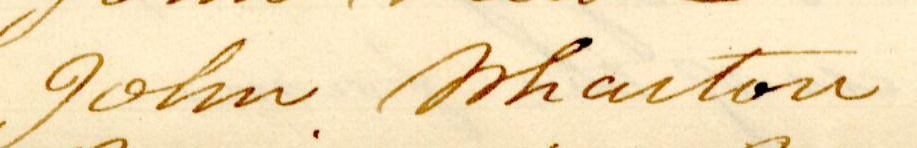John Wharton
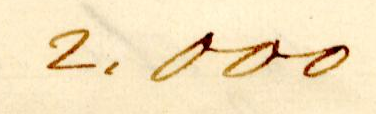2,000
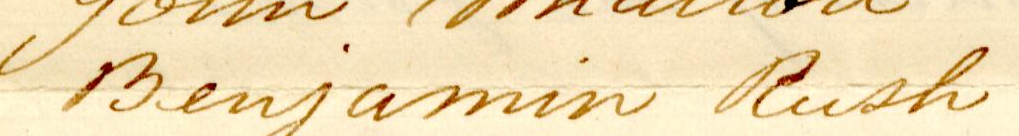Benjamin Rush
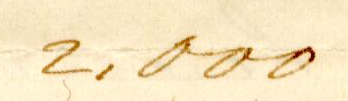2,000
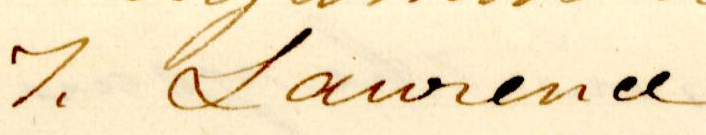T. Lawrence
